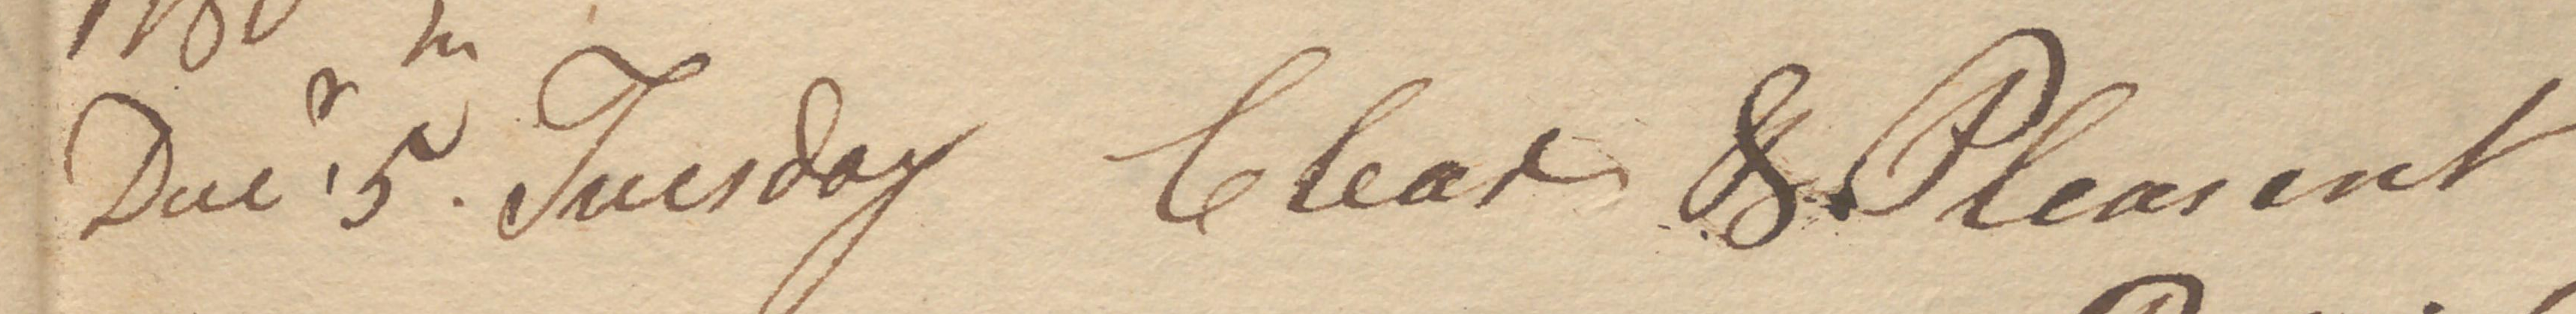Dece^r. 5^th Tuesday Clear & Pleasent
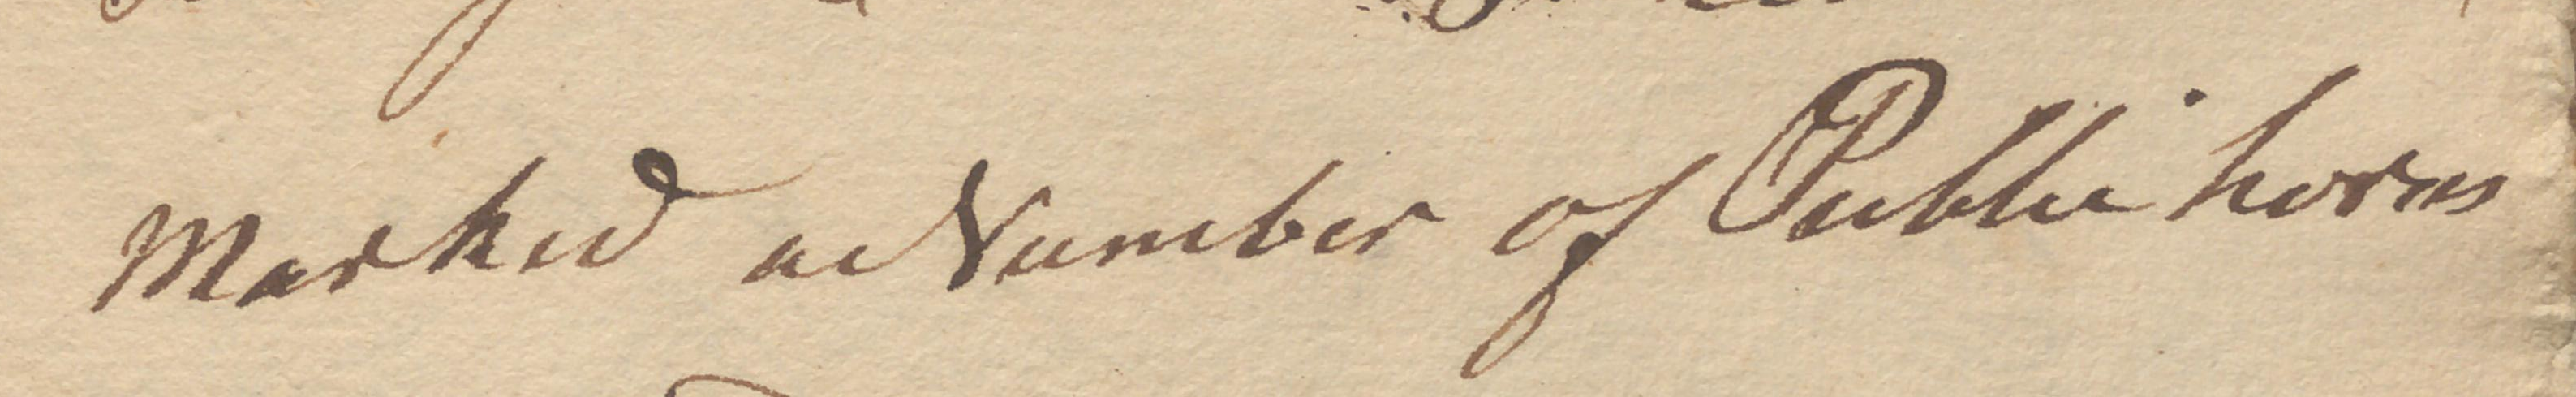Marked a Number of Public horses
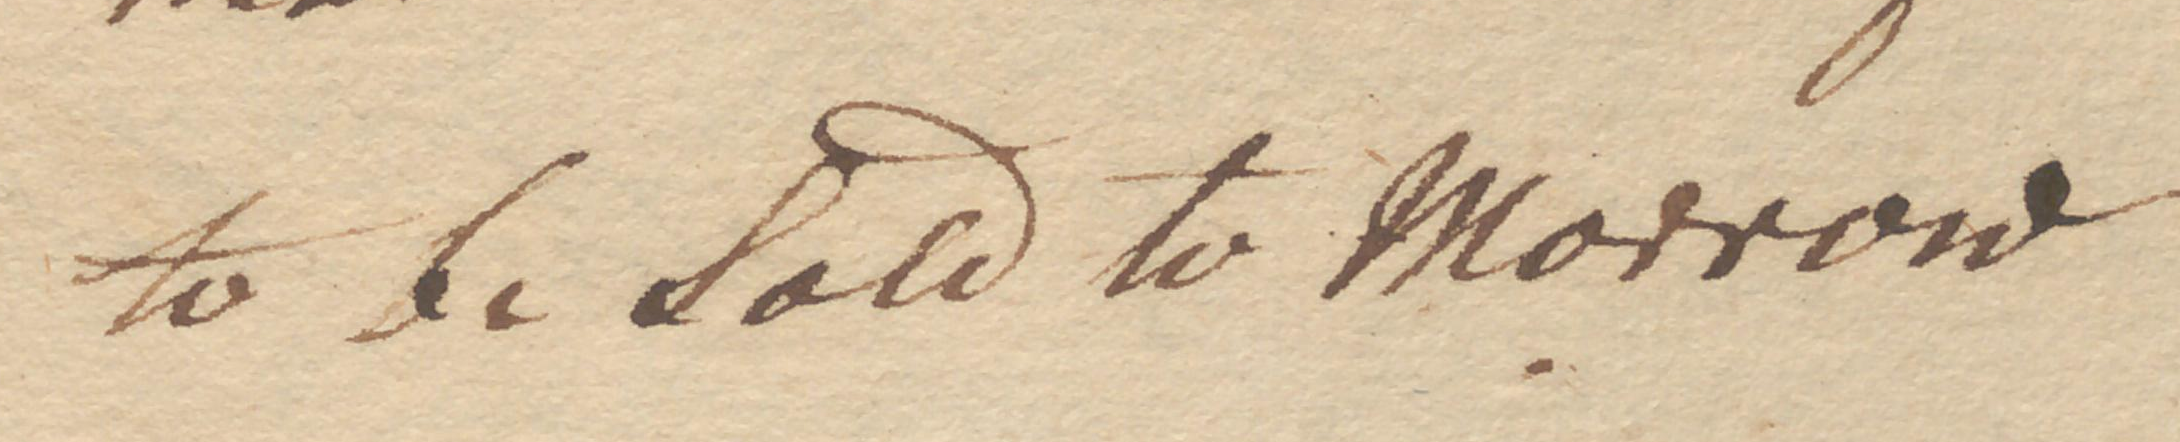to be sold to Morrow
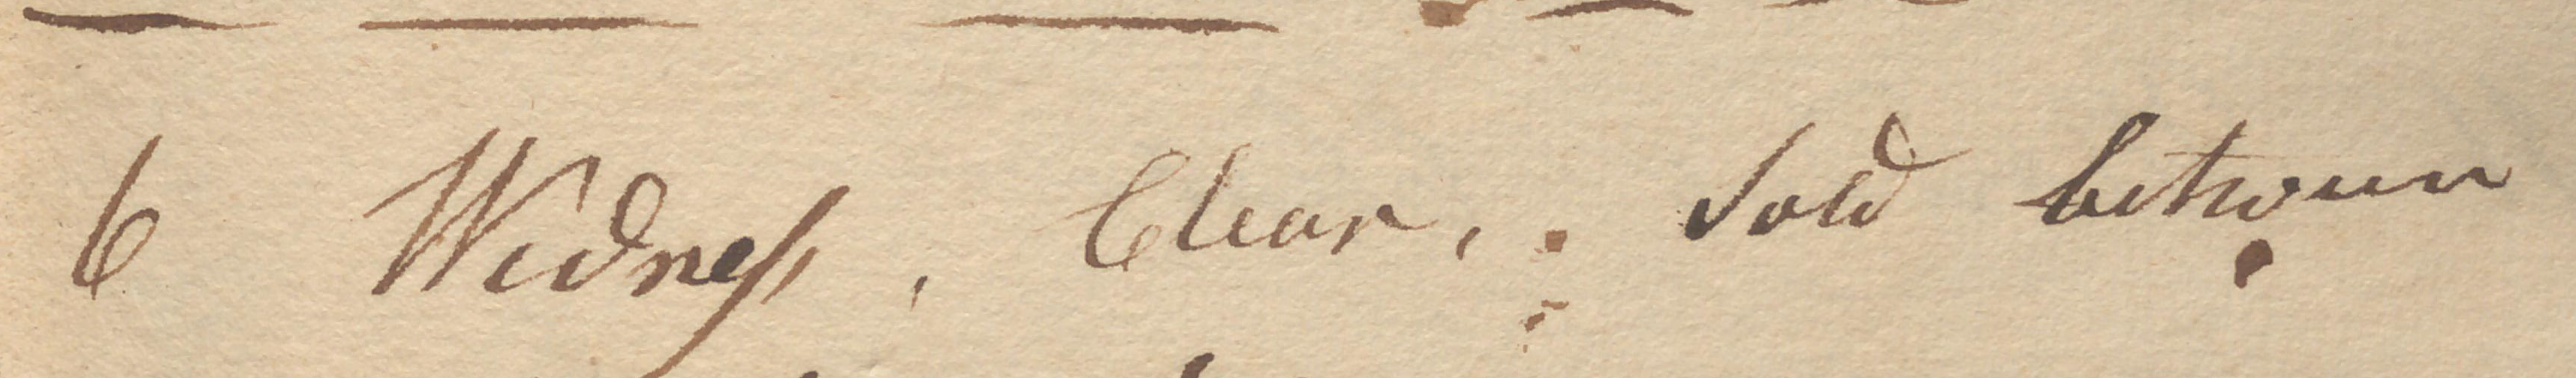6 Wedness Clear, sold between
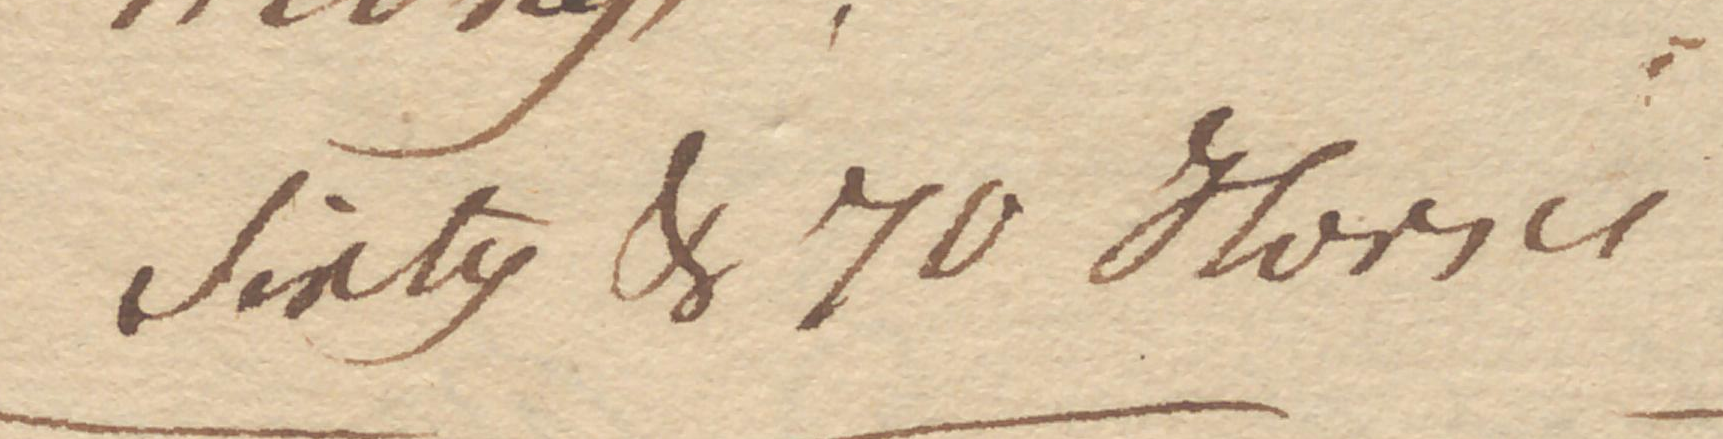Sixty & 70 Horses
